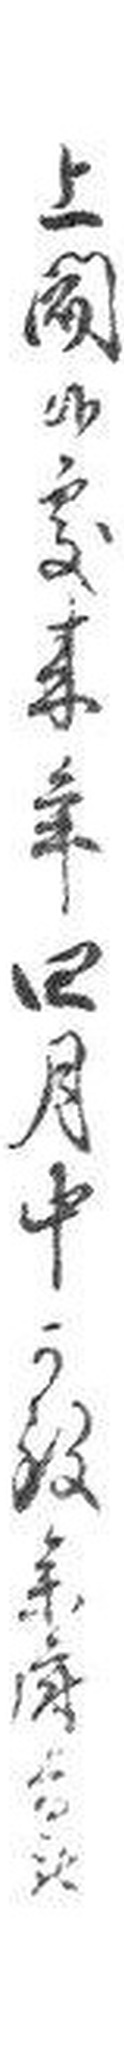上聞候処来年四月中可致参府旨被
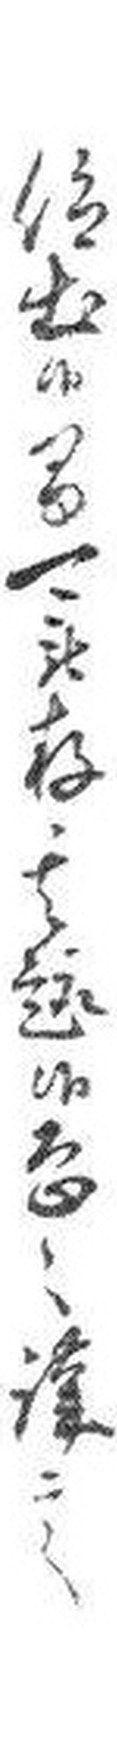仰出候間可被存其趣候恐々謹言
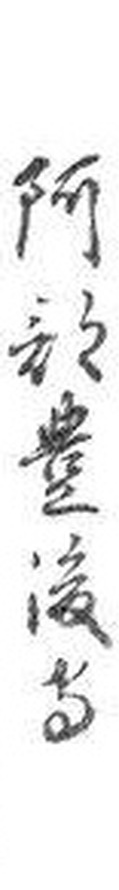阿部豊後守
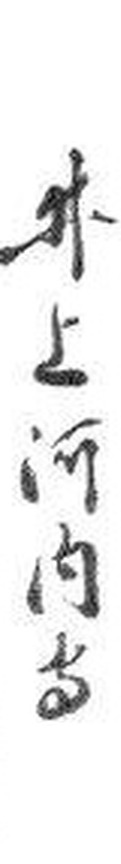井上河内守
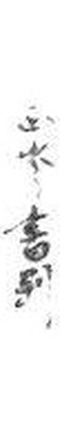正岑書判
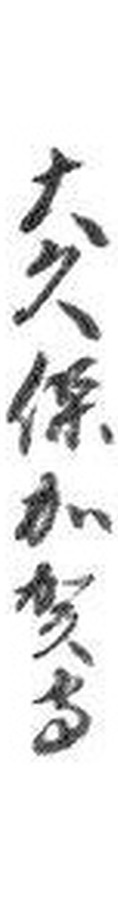大久保加賀守
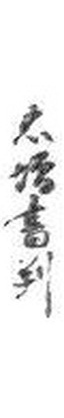忠増書判
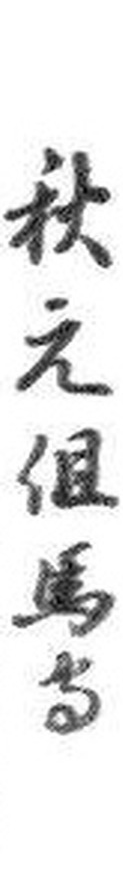秋元但馬守
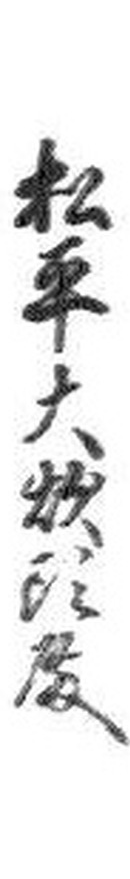松平大炊頭殿
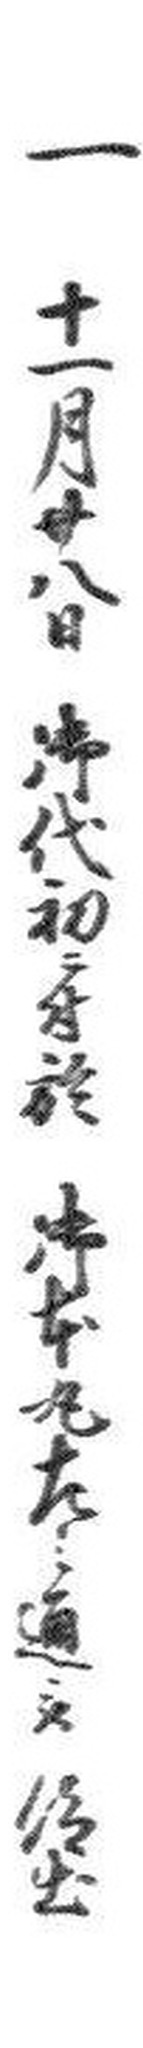一十一月廿八日御代初ニ付於御本丸左之通被仰出
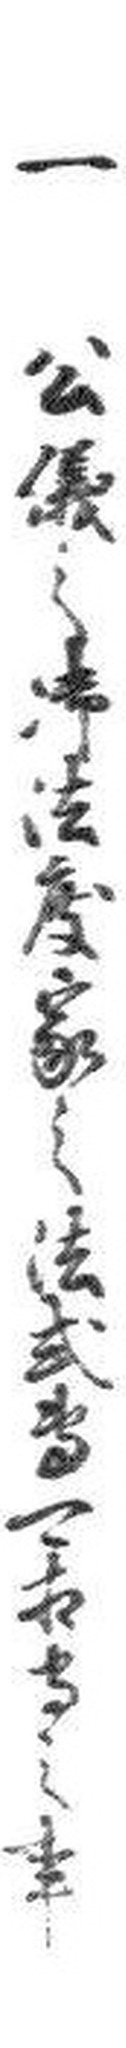一公儀之御法度家之法式専可相守之事
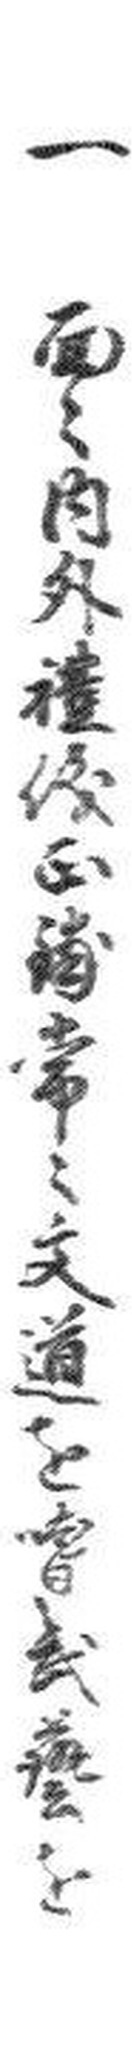一面々内外礼儀正鋪常々文道を嗜武芸を
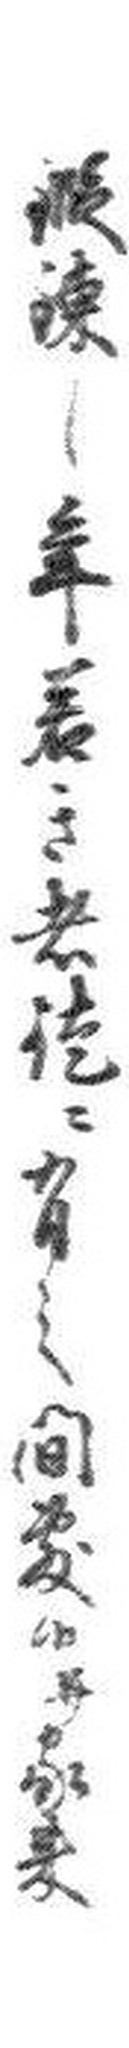鍛錬し年若き者徒ニ有之間敷候并家来

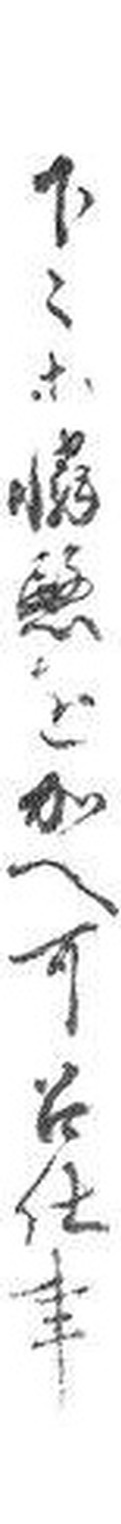下々等憐憫を加へ可召仕事
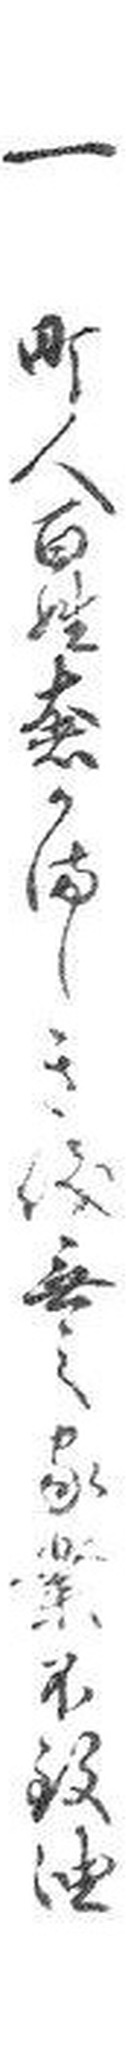一町人百姓奢かましき儀無之家業不致油
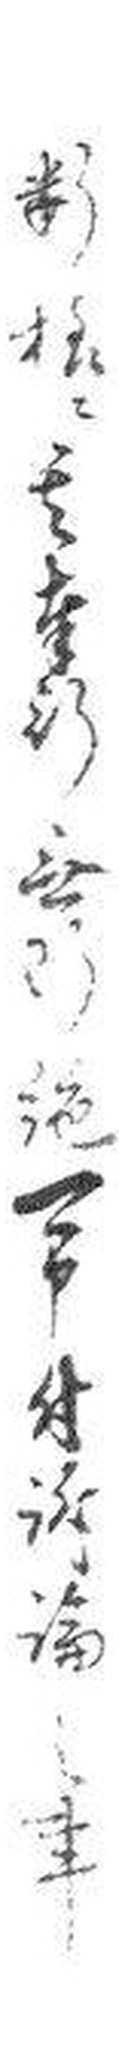断様ニ其奉行無断絶可申付訴論之事
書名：家譜 二十八 吉邦公 従宝永七年七月五日到正徳元年十二月
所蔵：福井県文書館 Fukui Prefectural Archives
